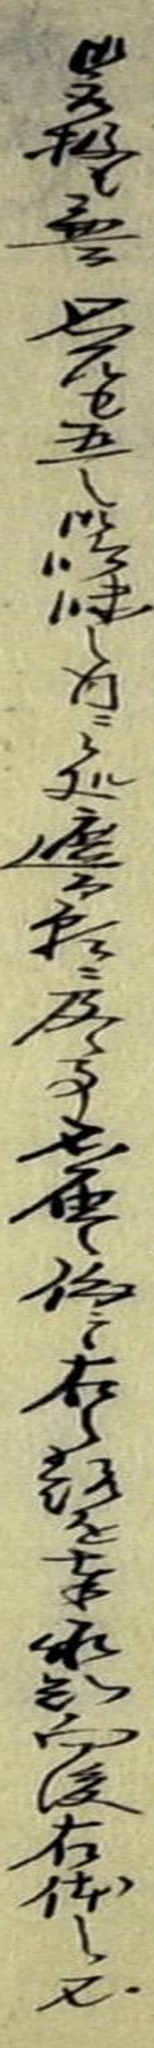御取扱も兼而思召も有之御吟味之内ニ候処遮而願ニ及候事不届之儀ニ候右之趣を奉承知向後右体之不
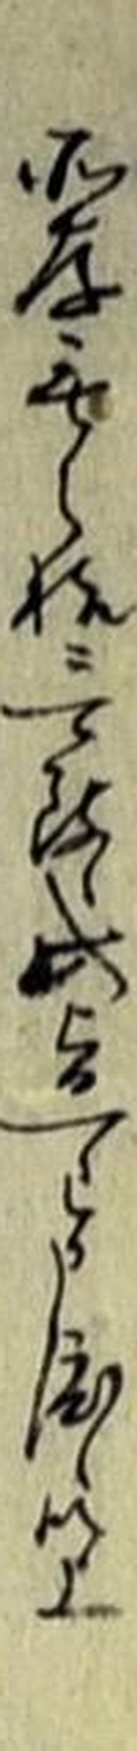所存無之様ニ可致候此旨可被申渡候以上
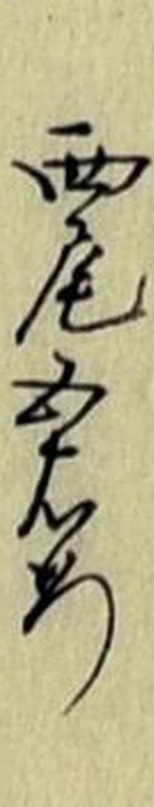西尾五右衛門
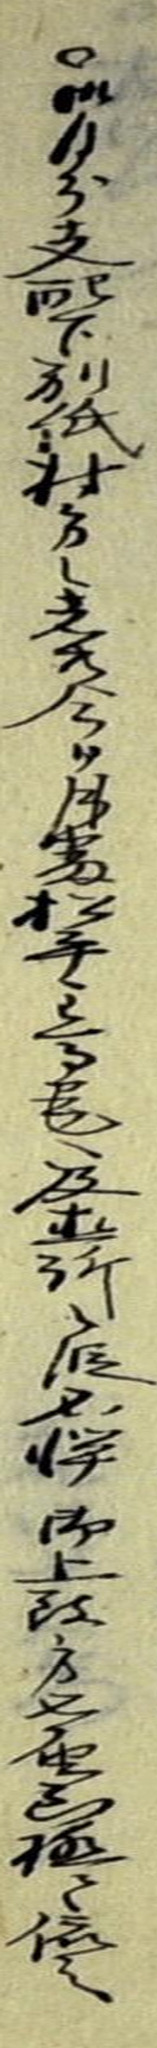〇御自分支配下別紙村方之者共今日月番松平主馬宅へ及直訴候段不憚御上致方不届至極ニ候依之
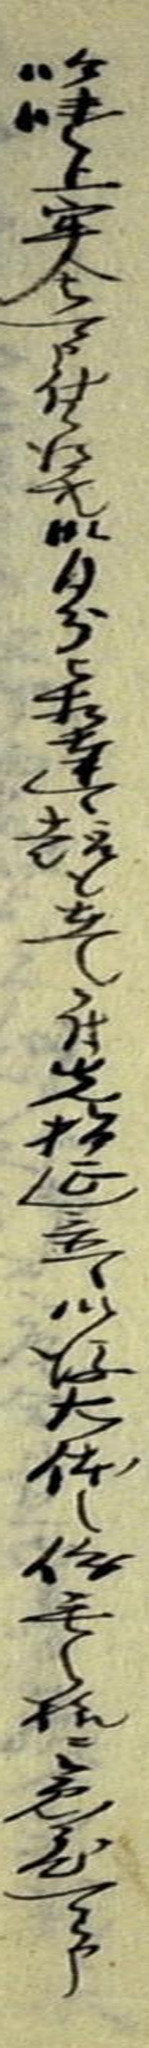吟味之上牢舎可申付候得共御自分被相達候趣も在之候ニ付先指延置候以後右体之儀無之様ニ急度可被申
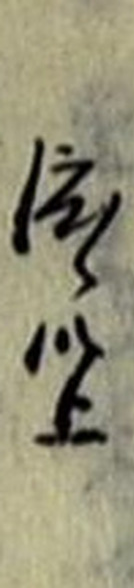渡候以上
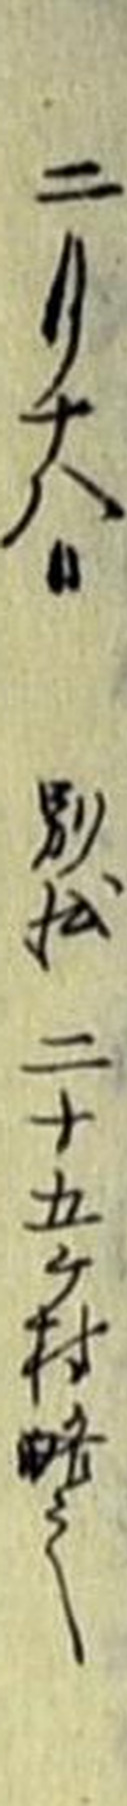二月十八日別紙二十五ケ村略之

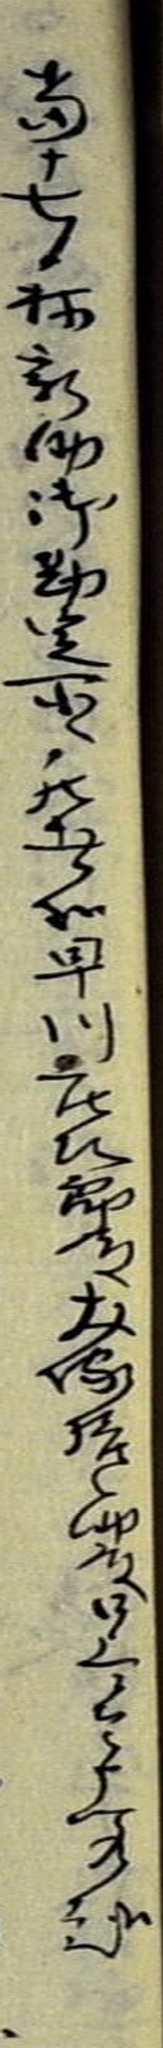当十七日林新助御勘定所へ罷出候処早川庄次郎殿犬塚権之助殿口上ニ而被申聞趣
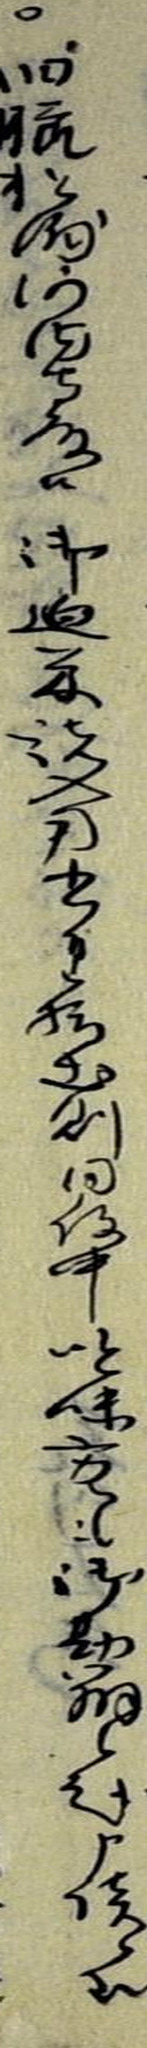〇旧臘松浦河内守殿江御廻米諸入用書付被指出則同役中吟味方へも御勘弁之趣申談候処
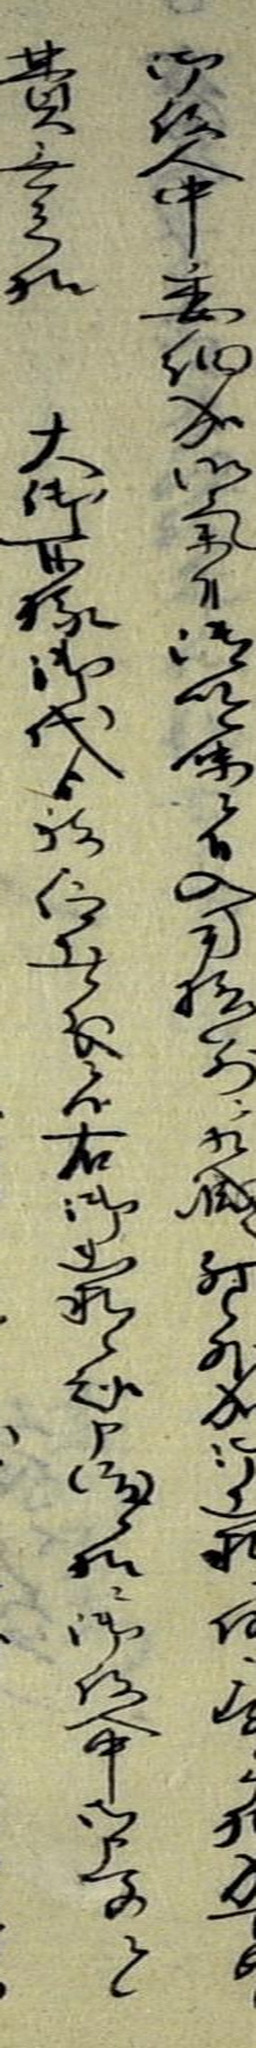費無之様大御所様御代ゟ被仰出候義ニ候右御出精之趣申渡候様ニ御役人中御申聞ニ候
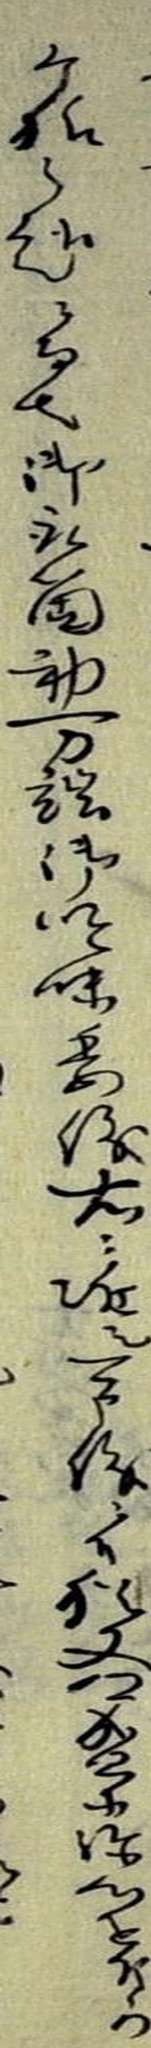ケ様之趣ニ而者御取箇初万端御吟味委儀右ニ准シ可申儀ニ付猶又郷盛等弥心を付可
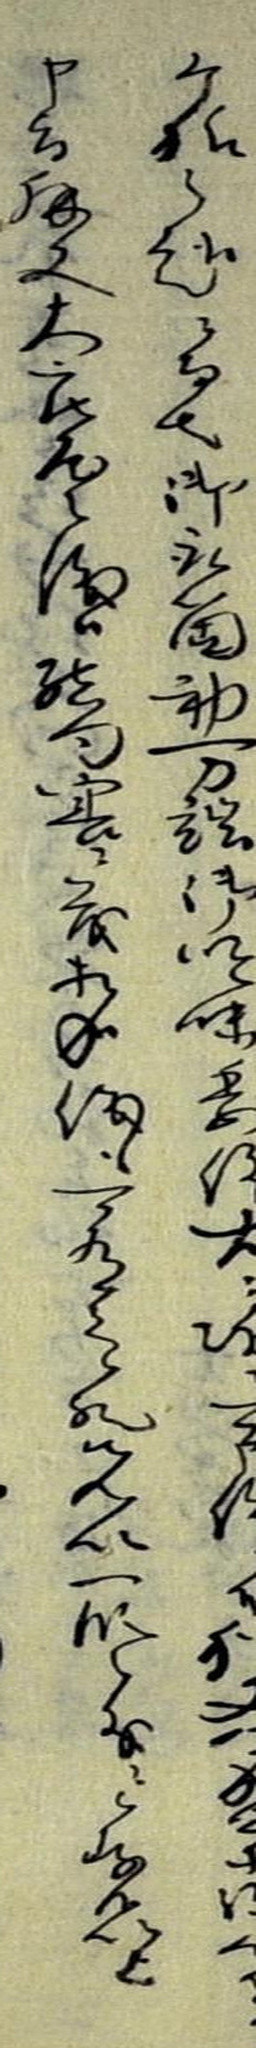申旨殊又大庄屋之儀ハ結句害ニ茂相成儀も可有之候歟先以一段之義ニ被存候以上
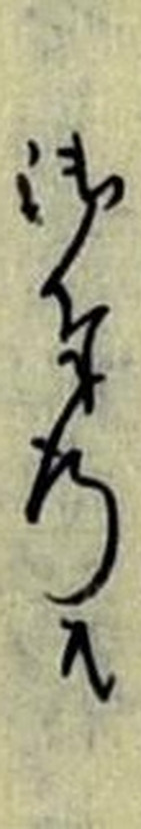御奉行共
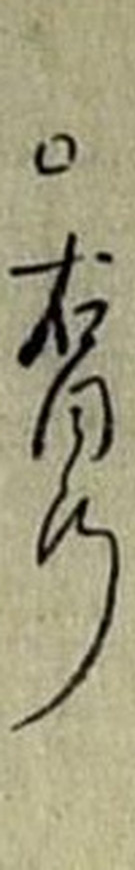〇右同断
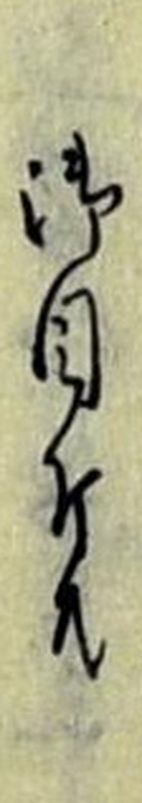御目付共
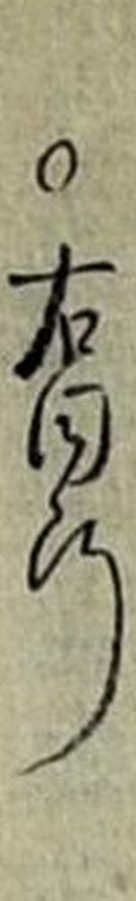〇右同断
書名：命令之部 一
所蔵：福井県文書館 Fukui Prefectural Archives
